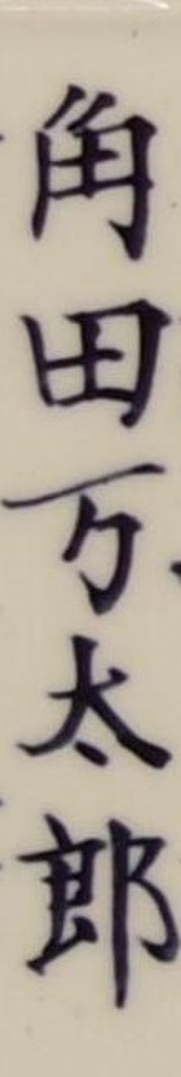角田万太郎
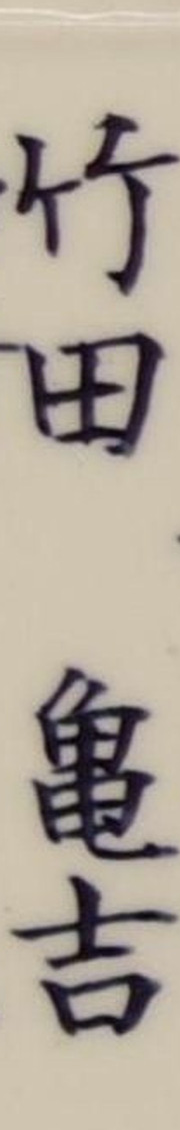竹田亀吉
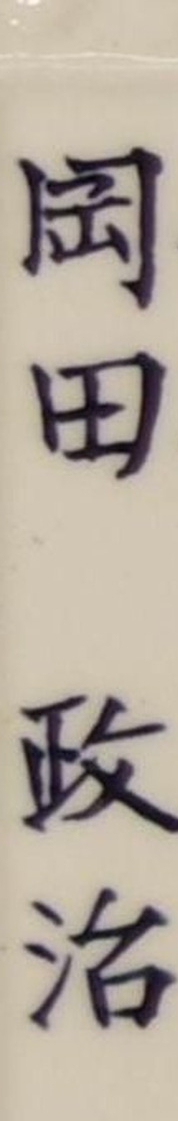岡田政治

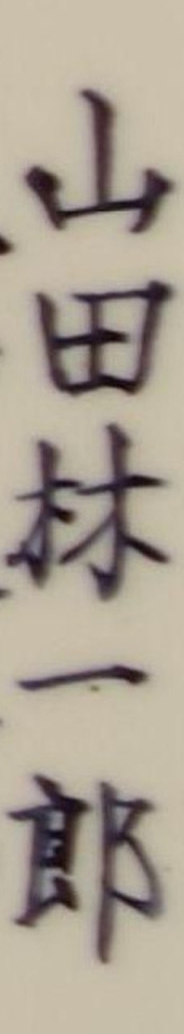山田林一郎
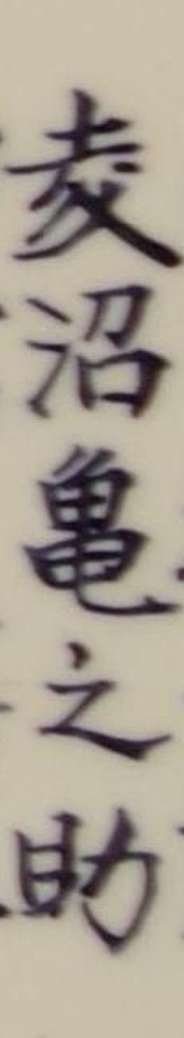麦沼亀之助
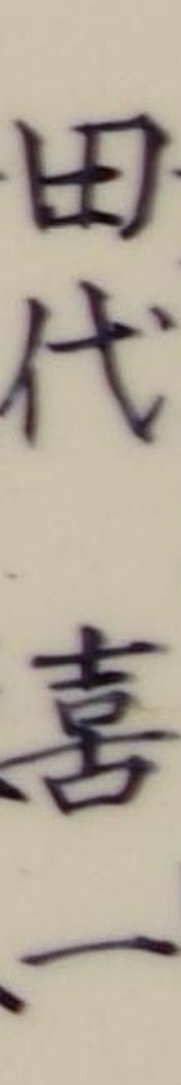田代喜一
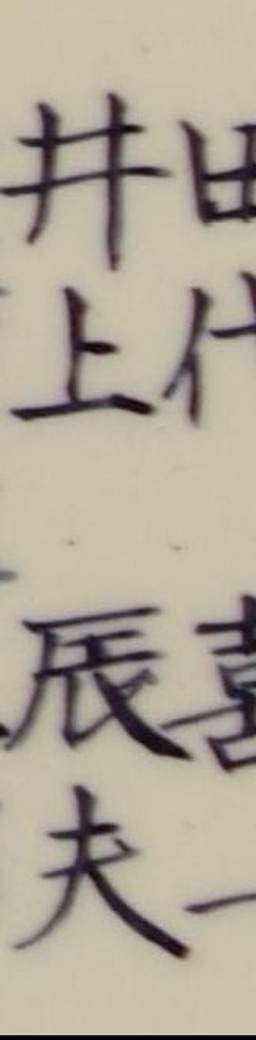井上辰夫
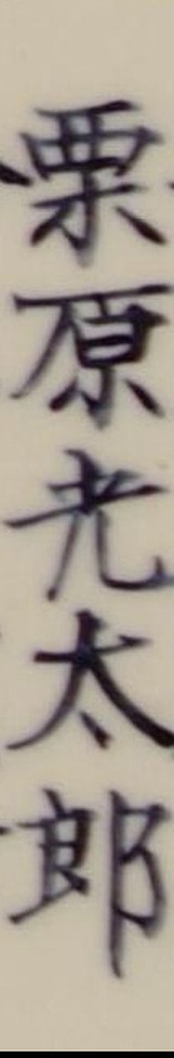桑原光太郎
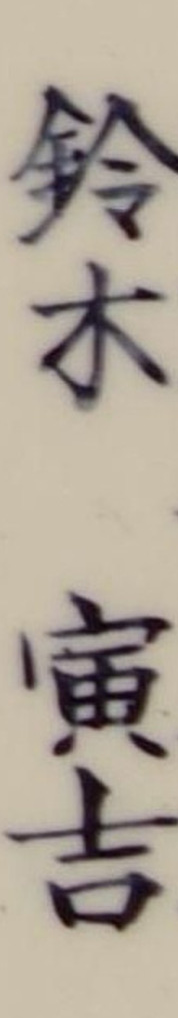鈴木寅吉
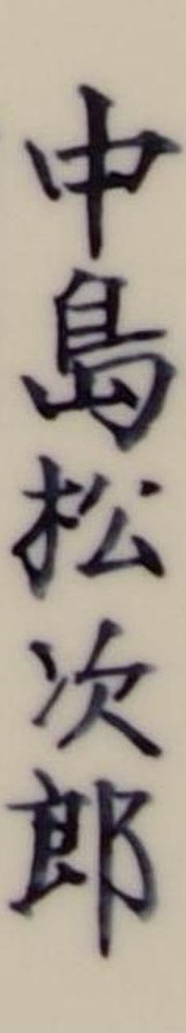中島松次郎
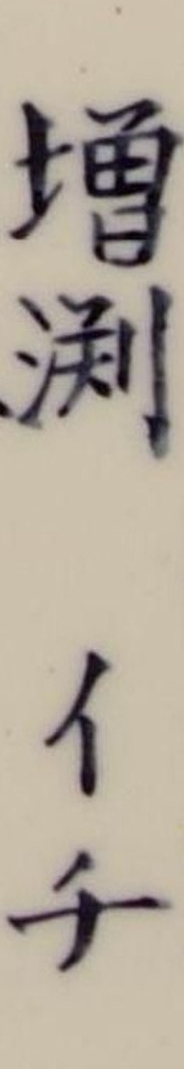増渕イチ
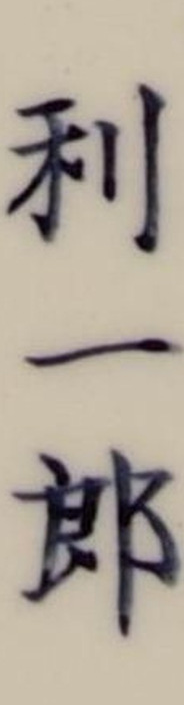利一郎
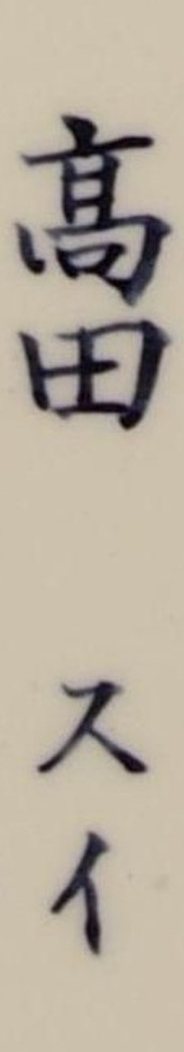高田スイ
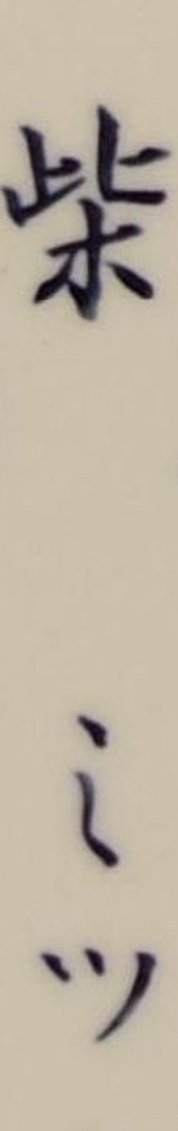柴ミツ
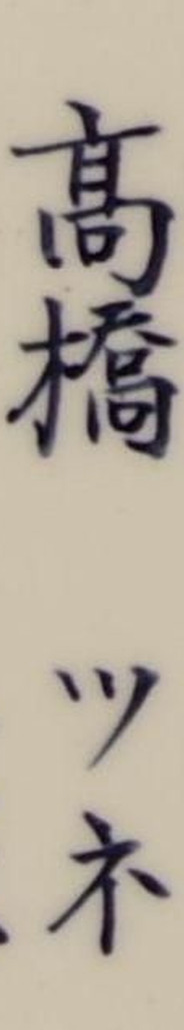高橋ツネ
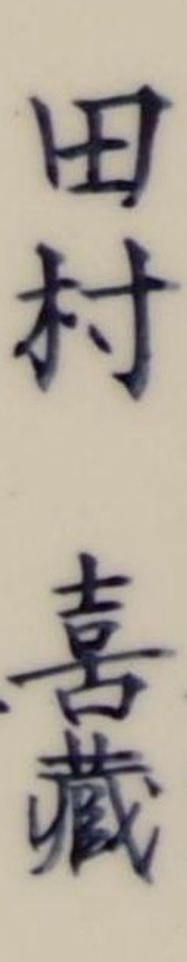田村喜蔵
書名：E~L
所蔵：高野山金剛峯寺
